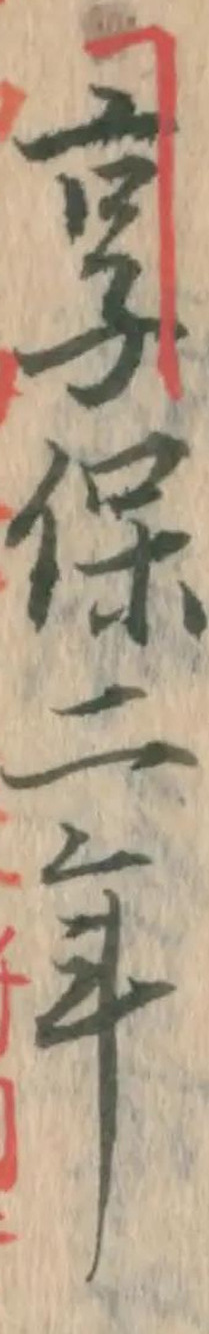享保二年
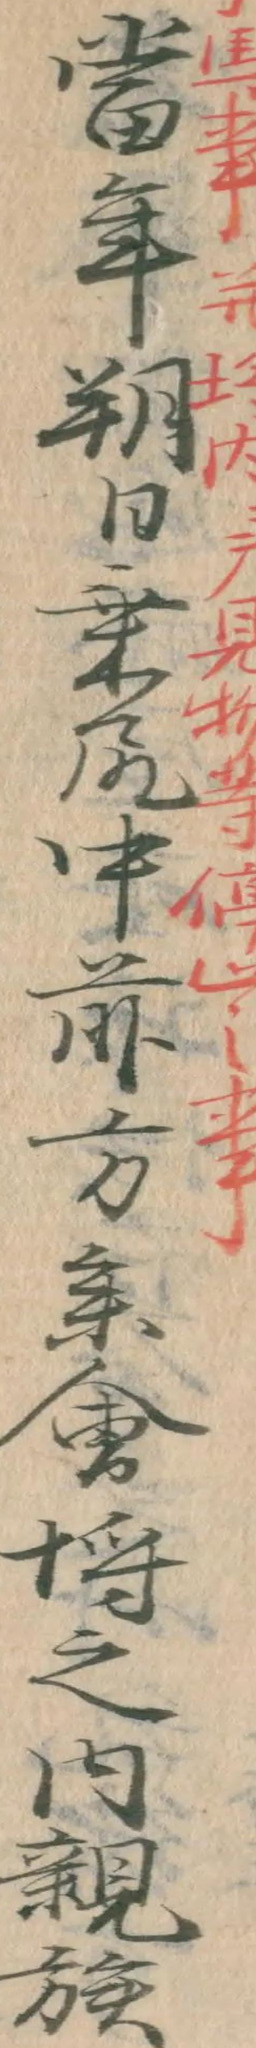当年朔日乗尻中前方参会埒之内親族
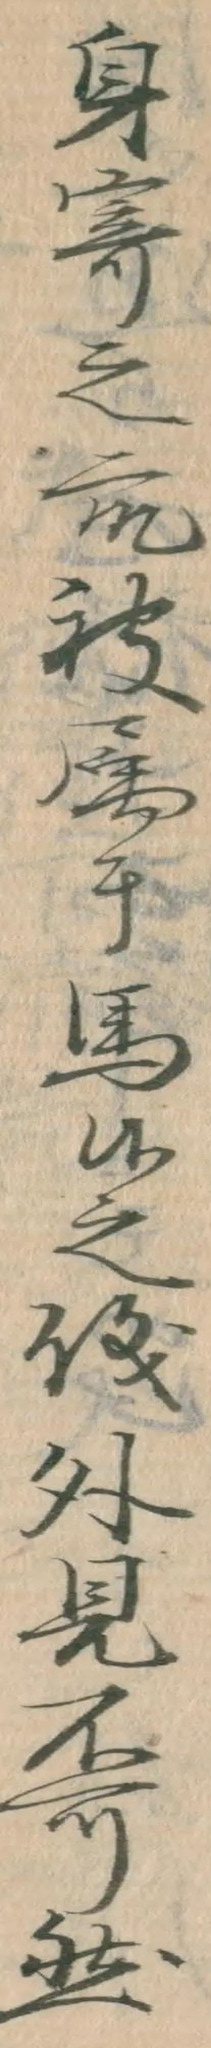身寄之衆被属于馬候之儀外見不可然
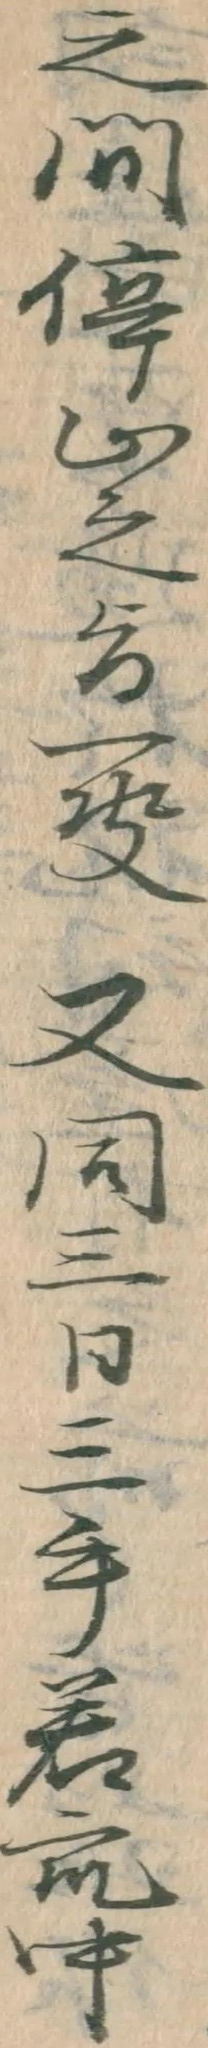之間停止之旨一決又同三日三手若衆中
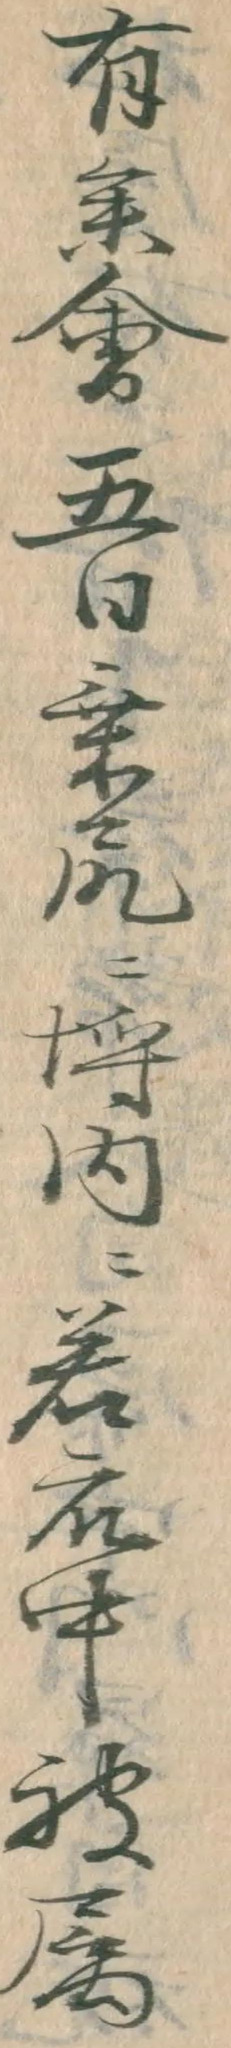有参会五日乗尻ニ将内ニ若衆中被属
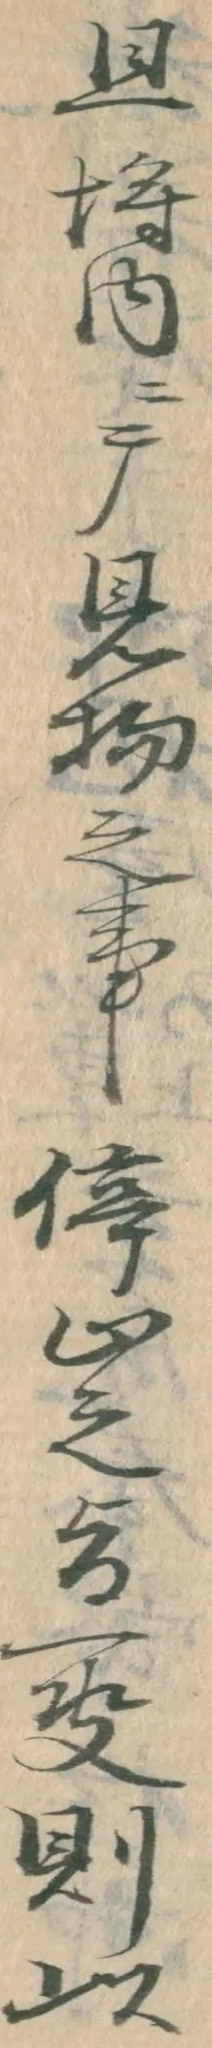且埒内ニテ見物之事停止之旨一決則以
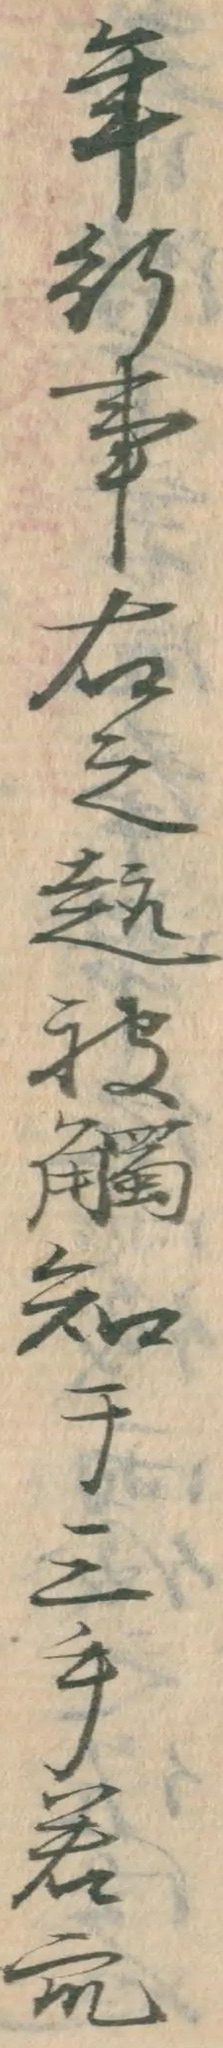年行事右之趣被触知于三手若衆
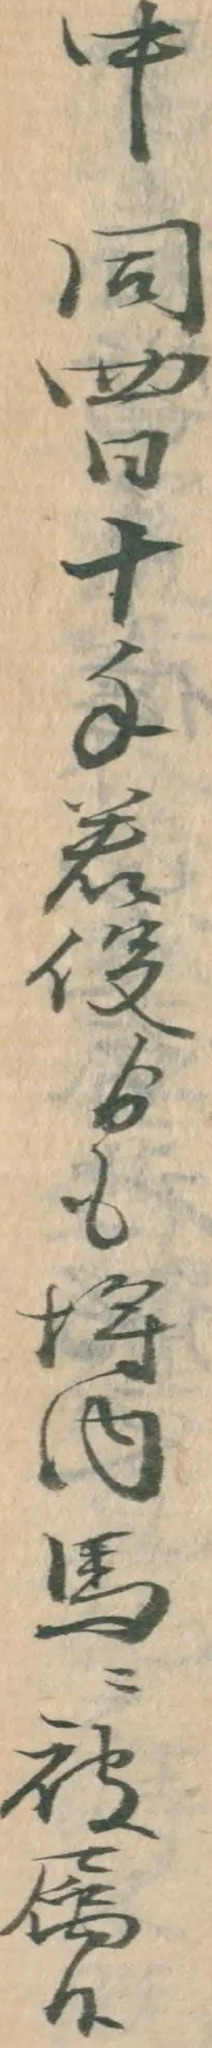中同四日十手若役ゟも埒内馬ニ被属候

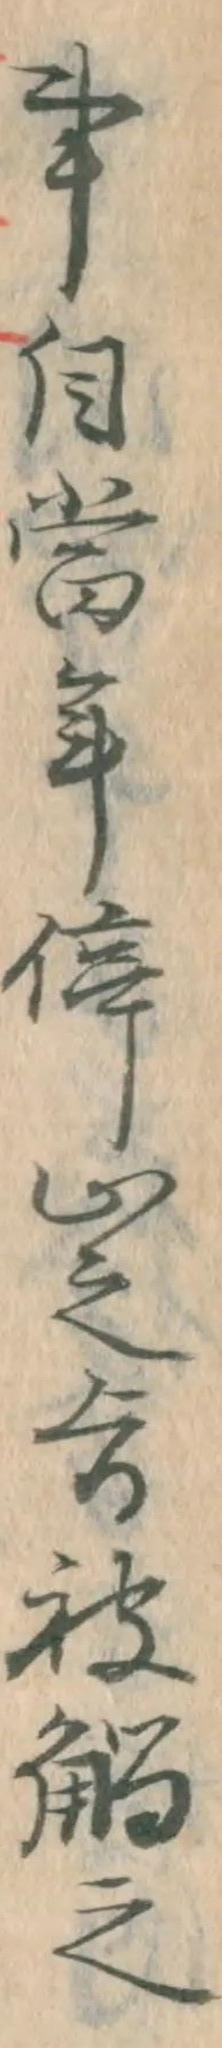事自当年停止之旨被触之
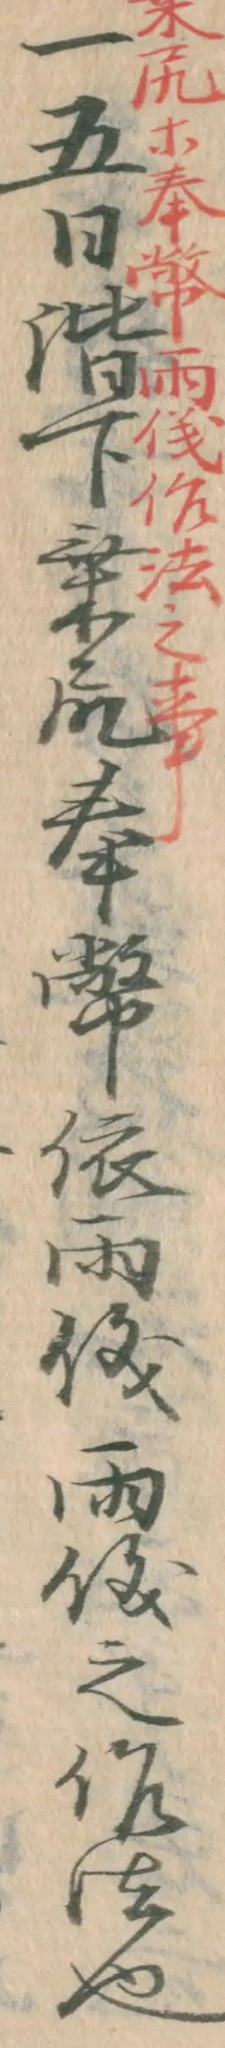一五日階下乗尻奉幣依雨儀雨儀之作法也
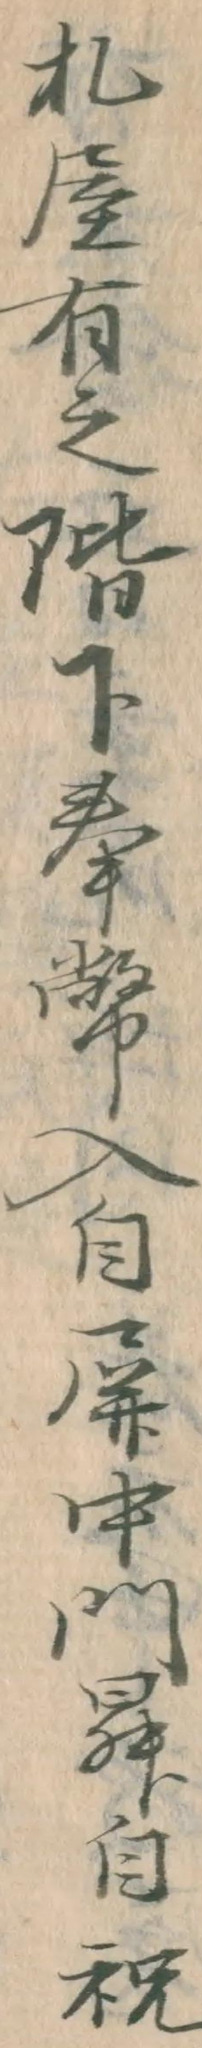札屋有之階下奉幣入自屏中門昇自祝
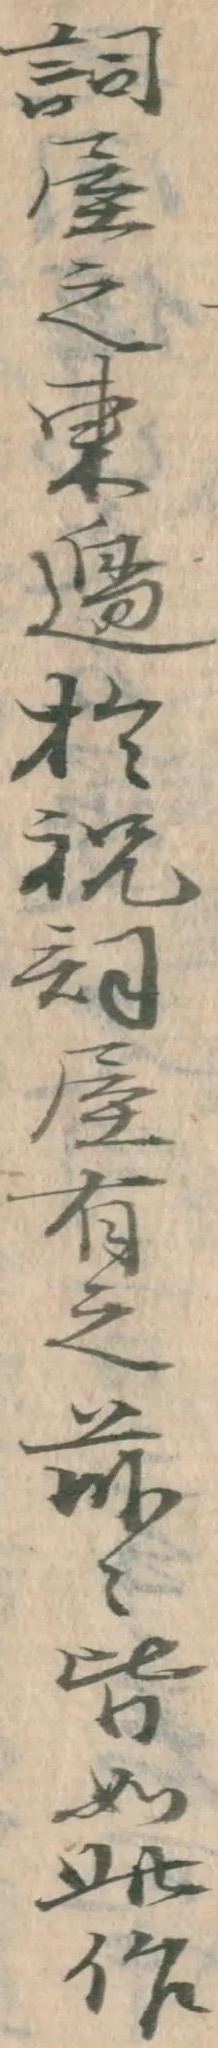詞屋之東辺於祝詞屋有之前々皆如此作
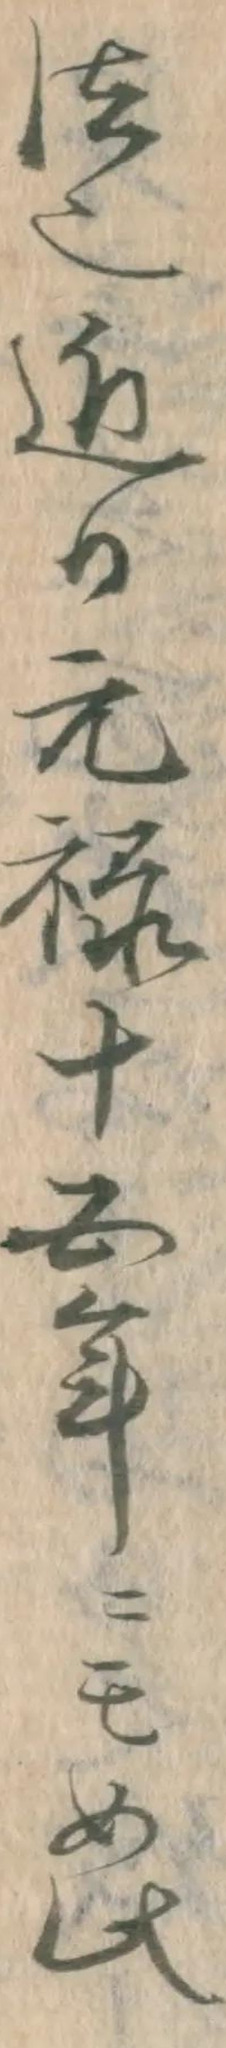法也近日元禄十五年ニも如此
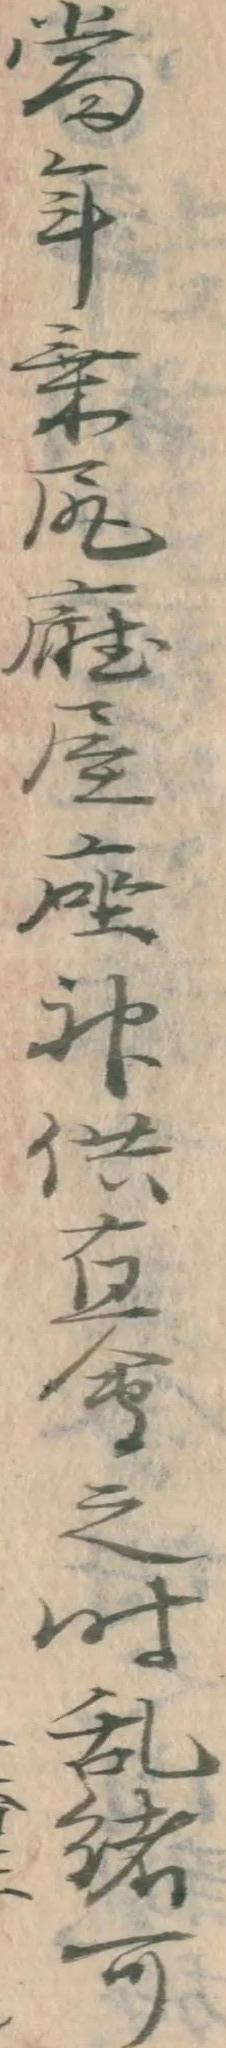当年乗尻庁屋座神供直会之時乱緒可
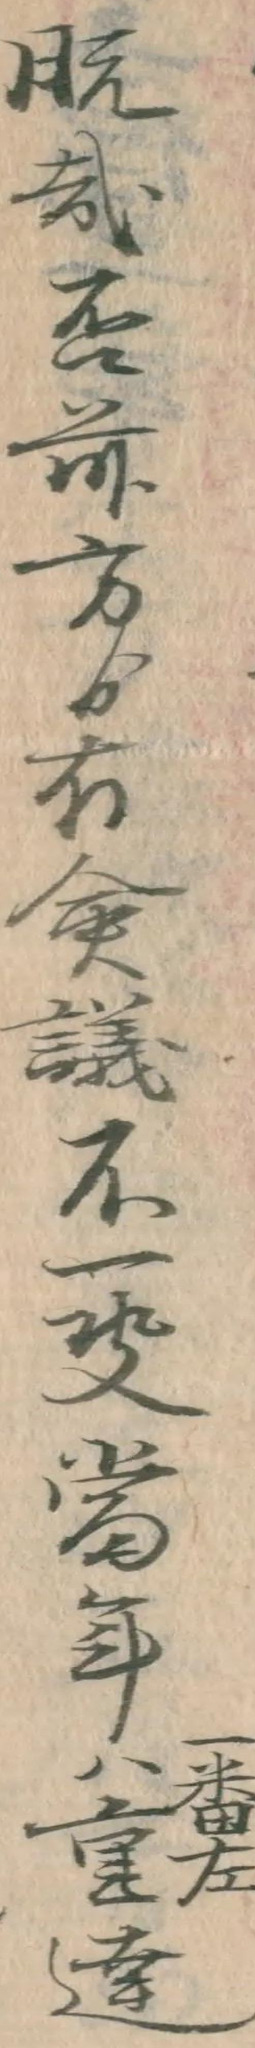脱哉否前方ゟ有僉議不一決当年ハ重達
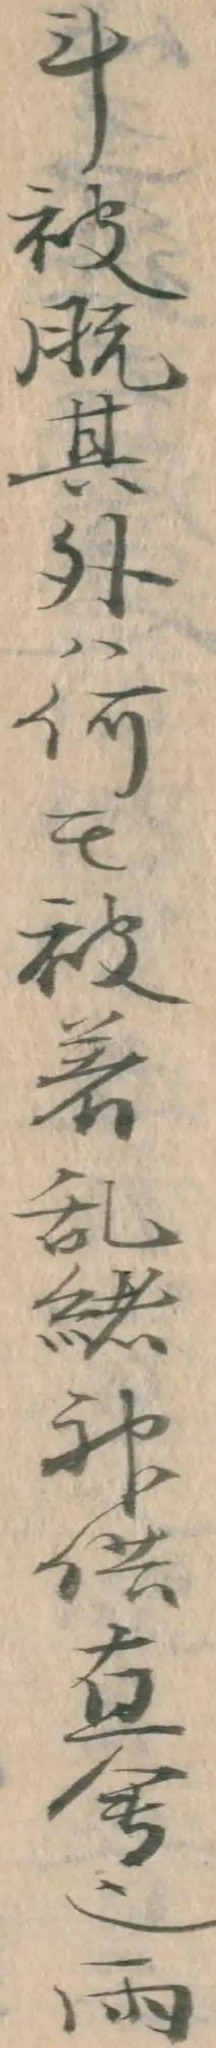計被脱其外ハ何モ被着乱緒神供直会也雨
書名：賀茂社記録. 第10冊
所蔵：国立国会図書館 National Diet Library, JAPAN
